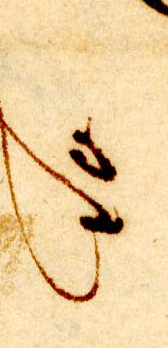To
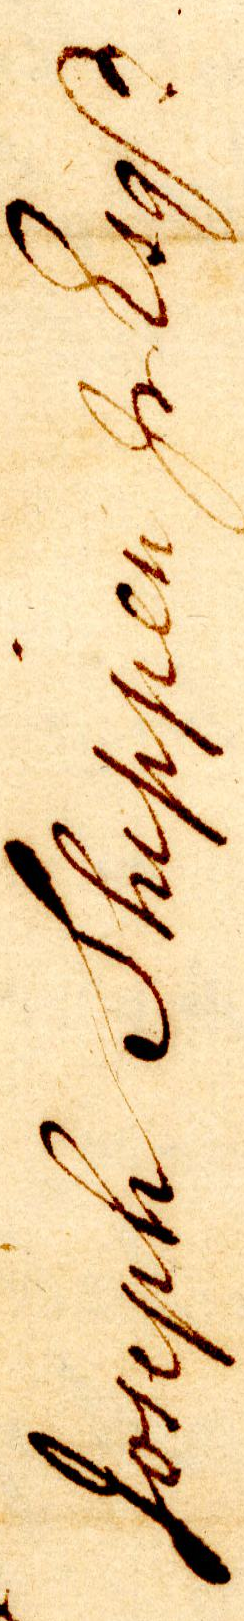Joseph Shippen Jr Esq^r.
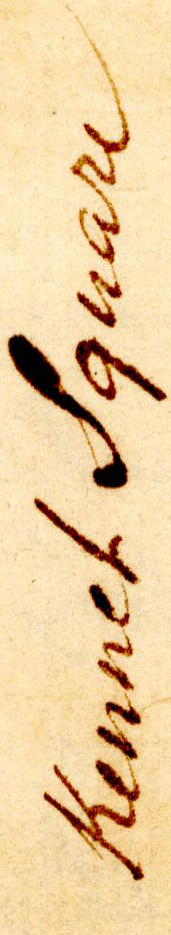Kennet Square
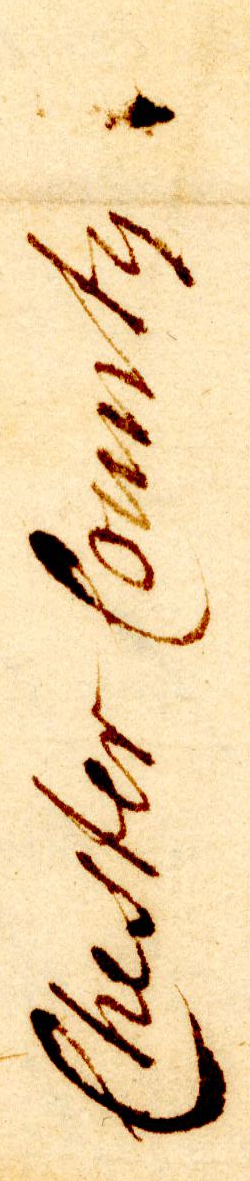Chester County
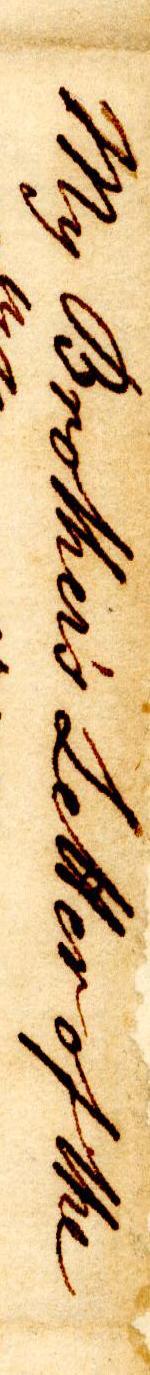My Brother's Letter of the
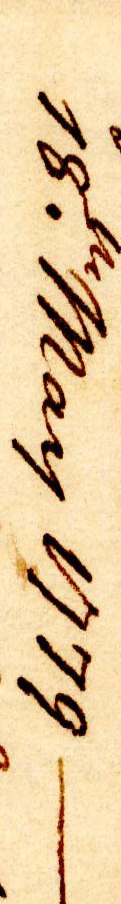18^th. May 1779-
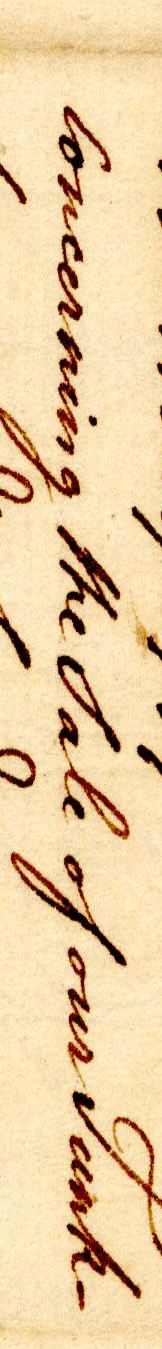concerning the Sale of our Tunk-
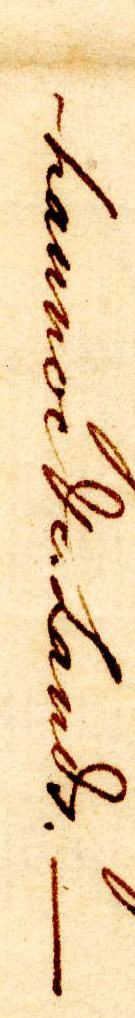-hannoc &c. Lands.-
